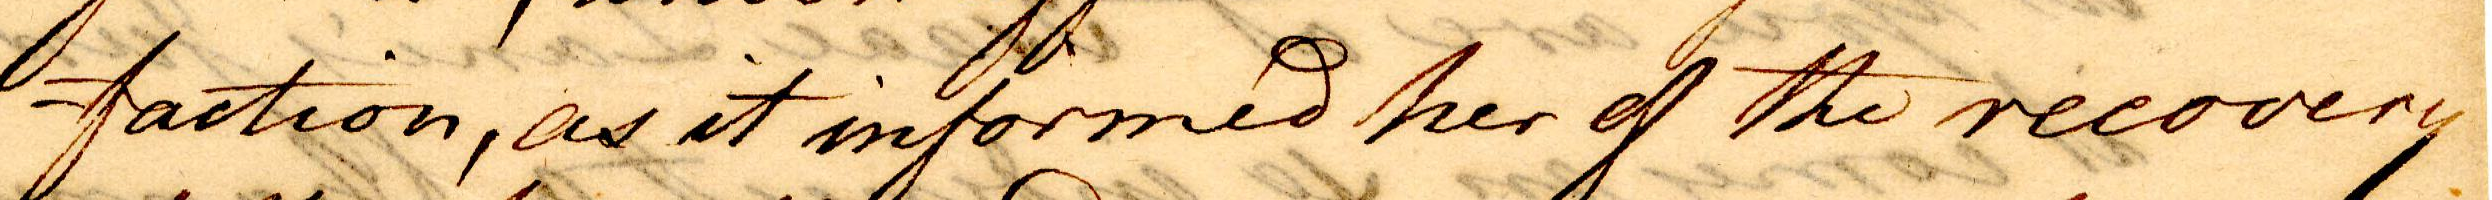-faction, as it informed her of the recovery
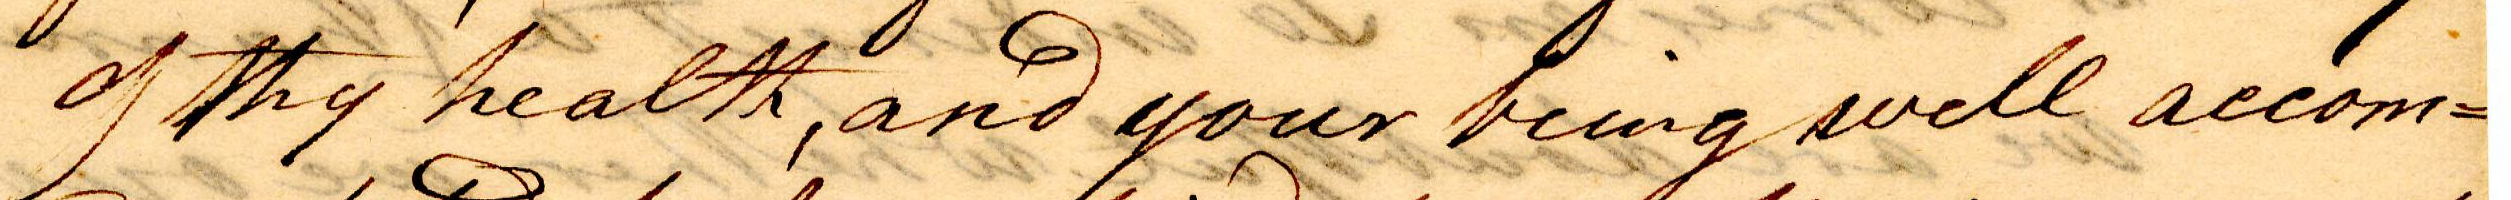of thy health, and your being well accom-
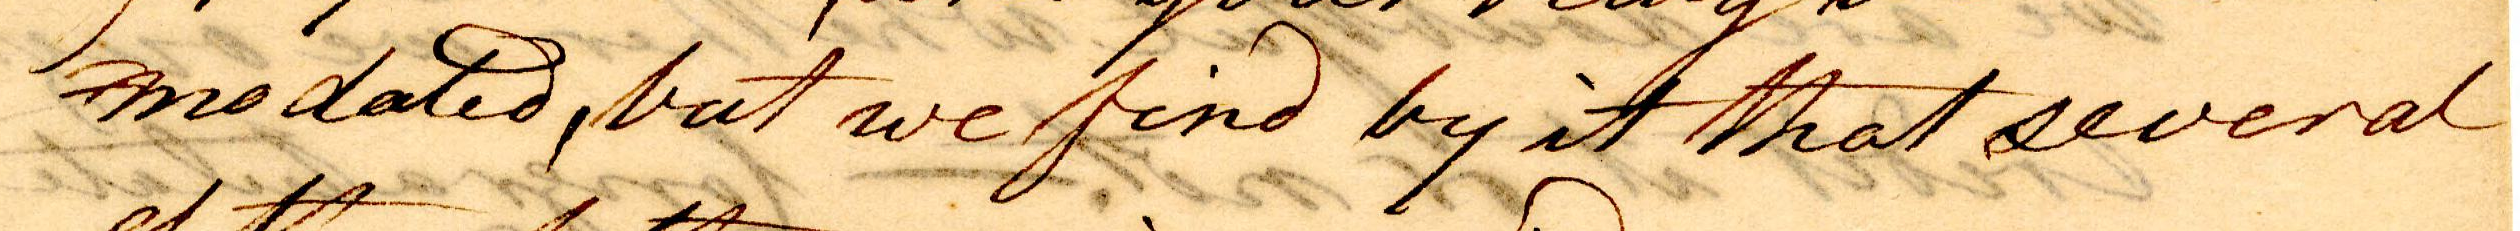-modated, but we find by it that several
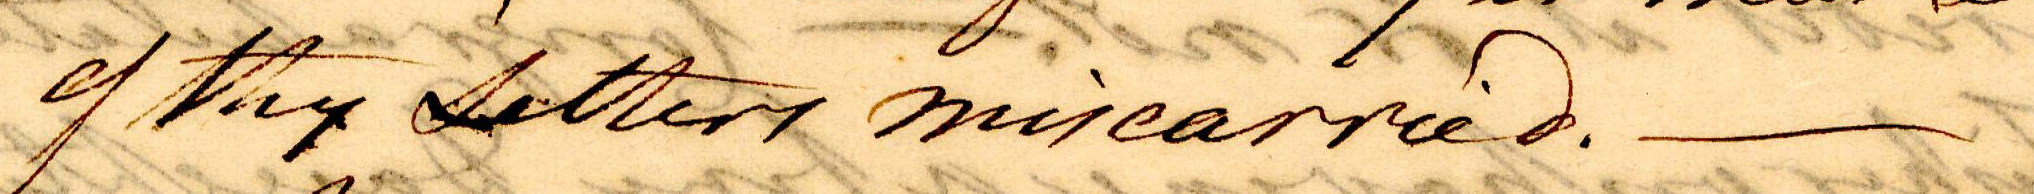of thy Letters miscarried.-
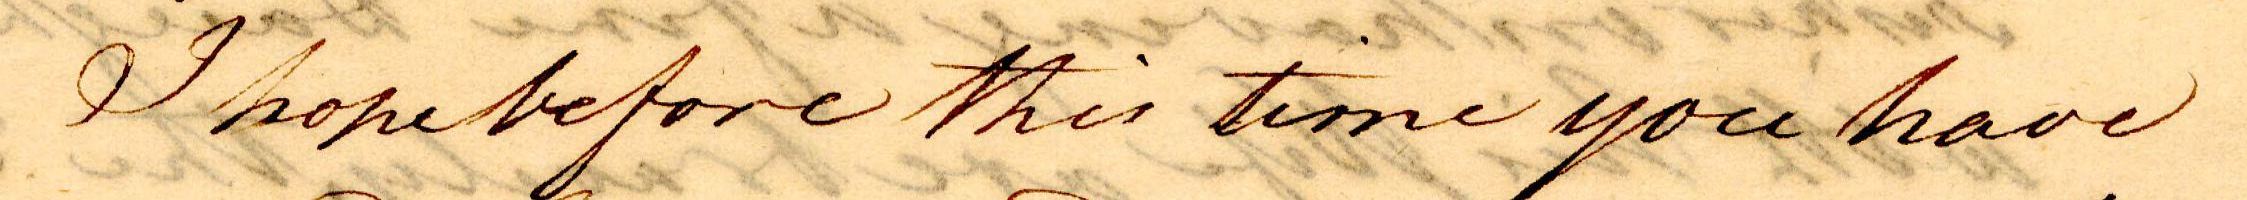I hope before this time you have
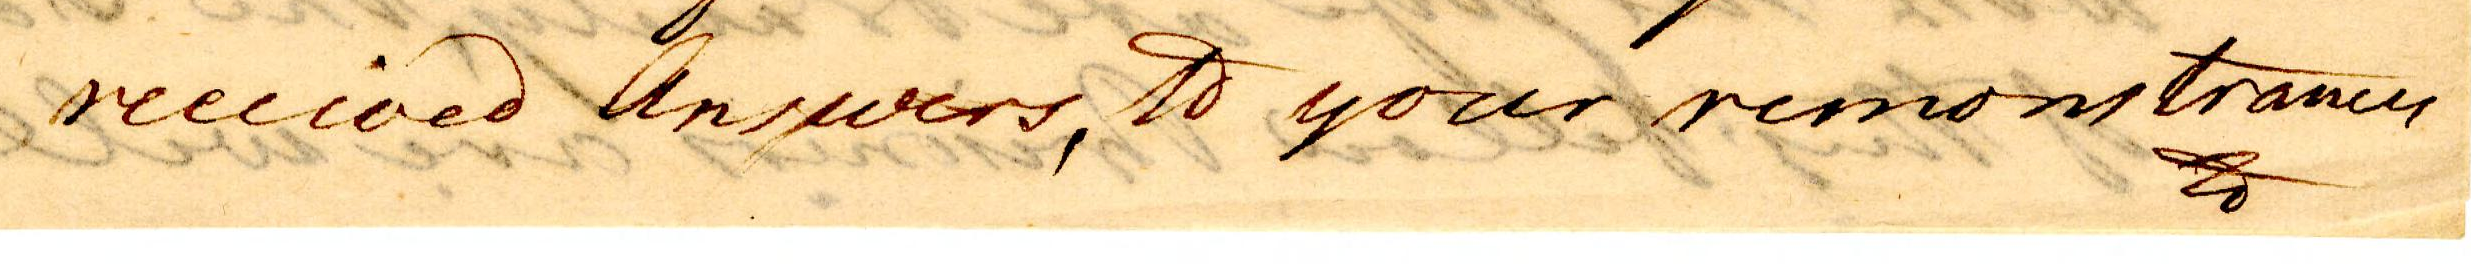received Answers, to your remonstrances
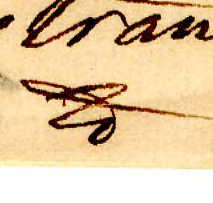to
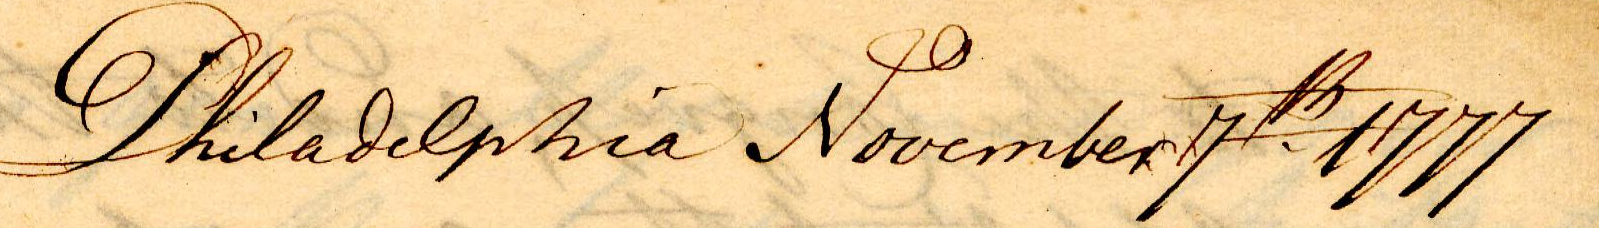Philadelphia November 7^th. 1777
